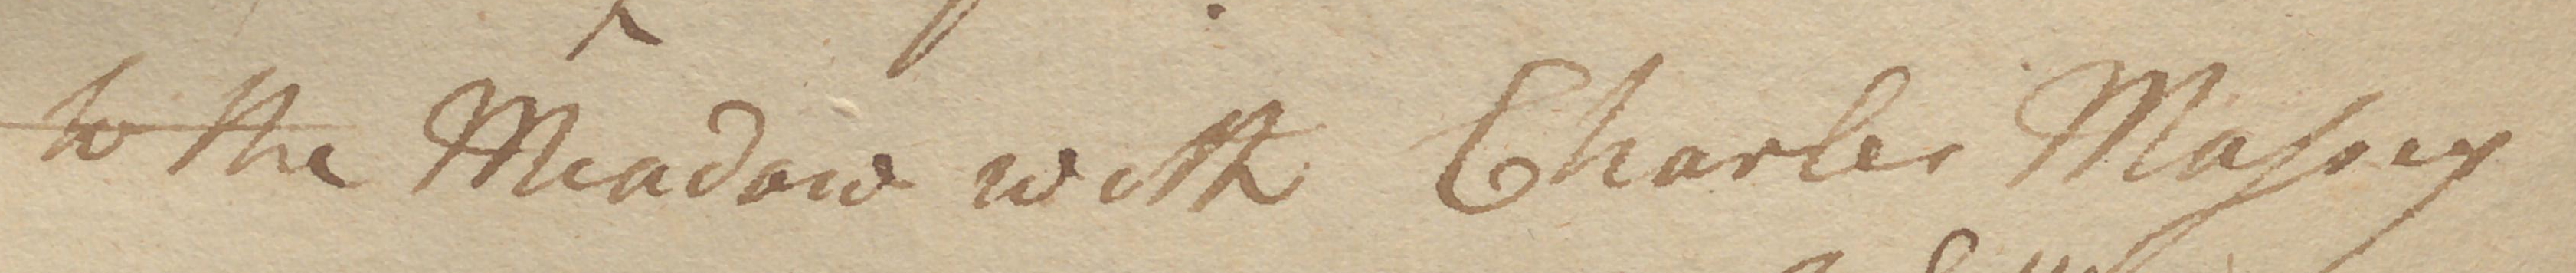to the Meadow with Charles Massey
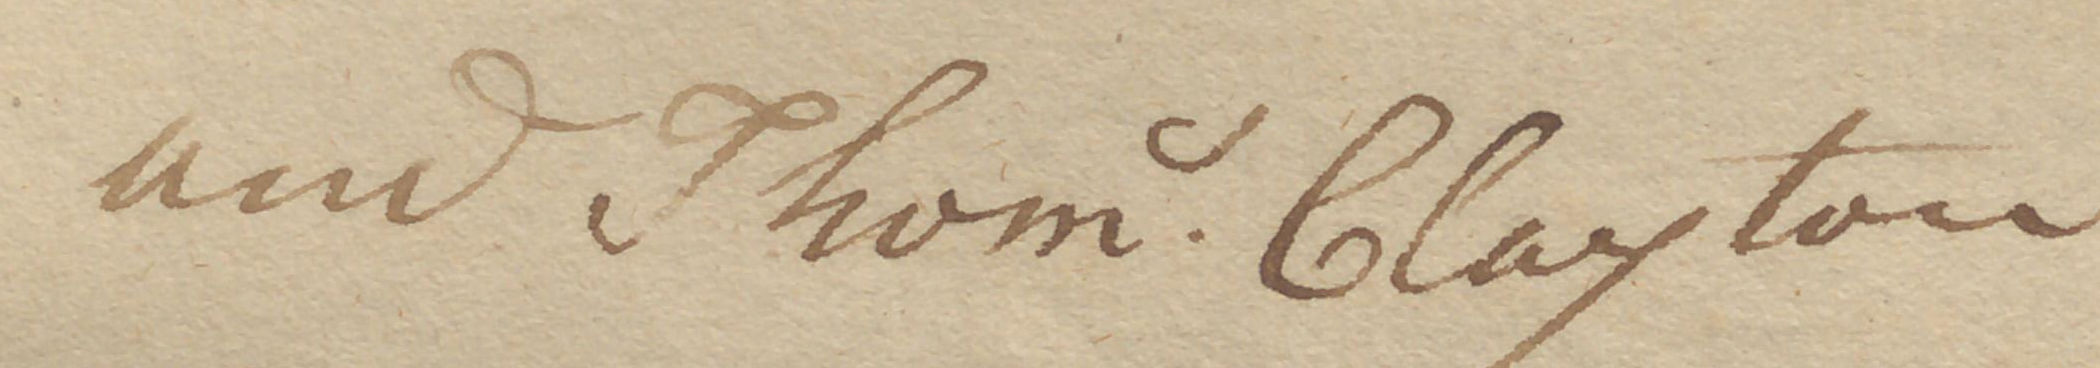am Thom^s. Clayton
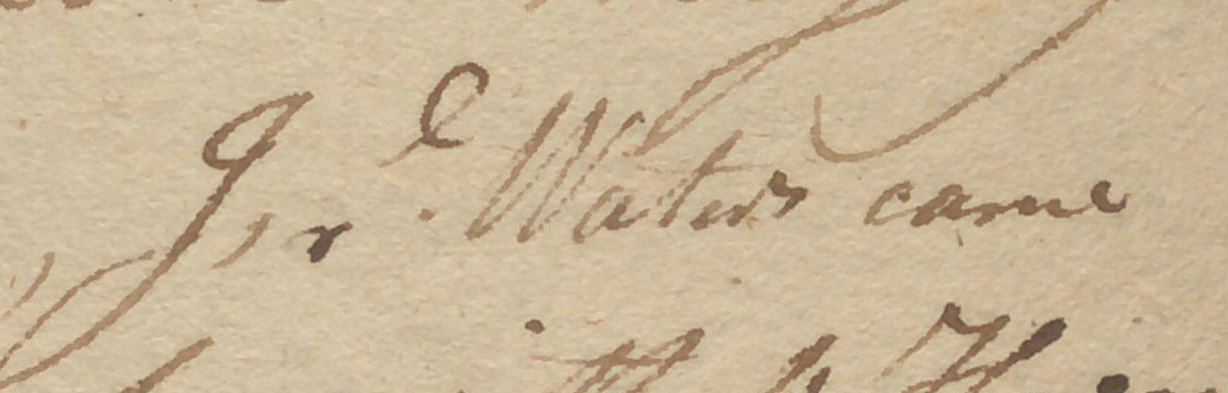Isr^l. Waters came
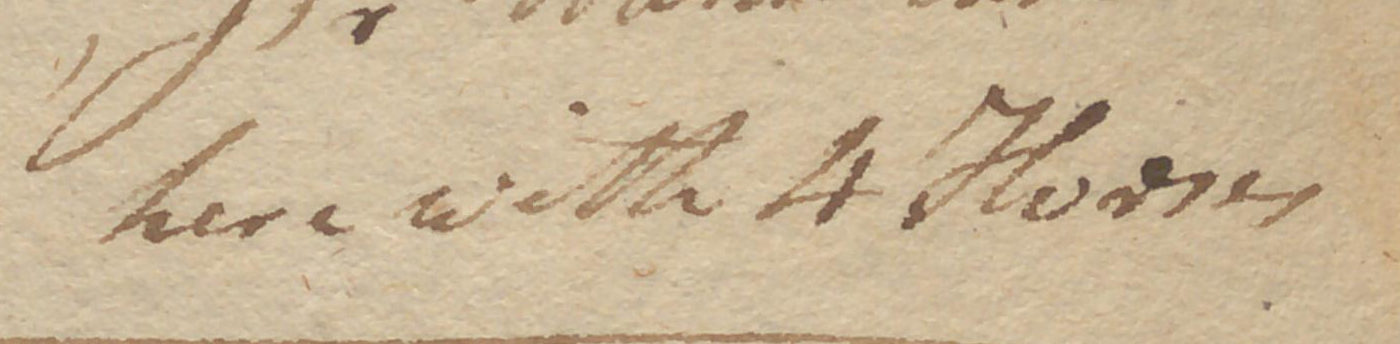here with 4 Horses
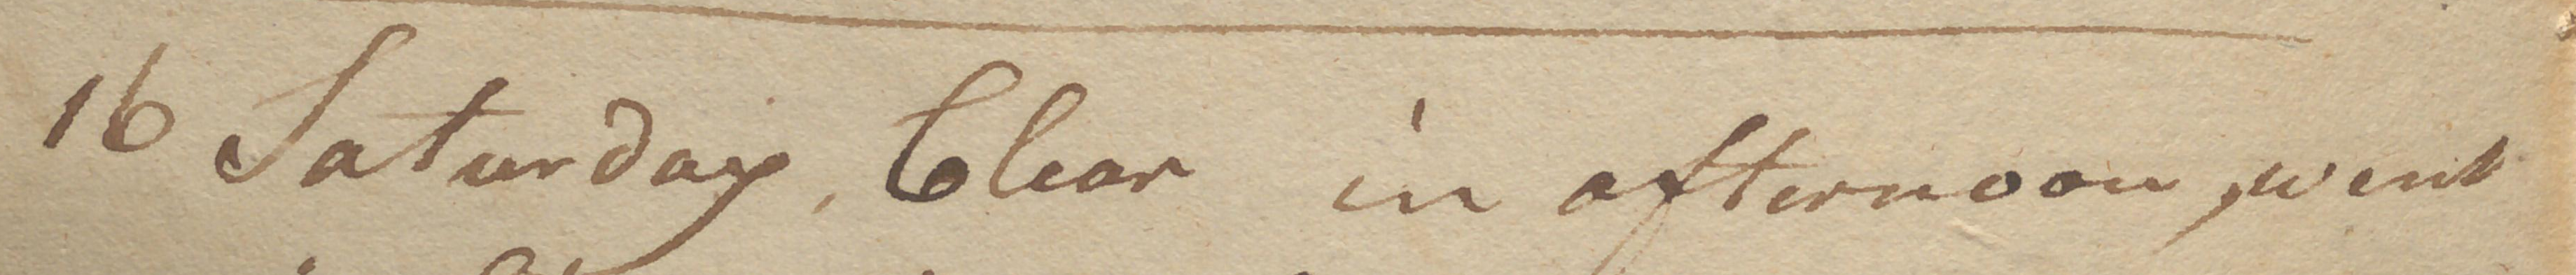16 Saturday Clear in afternoon, went
